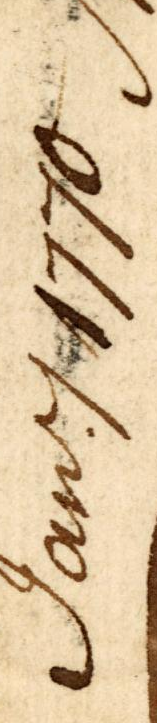Jan^y 1770
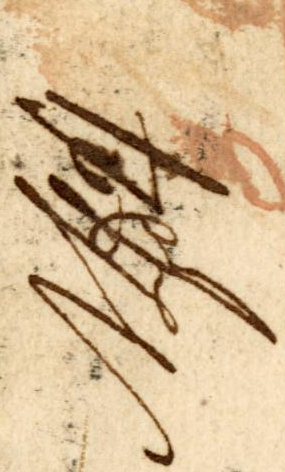N4d4
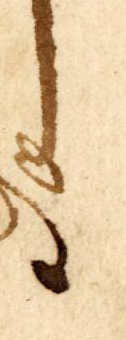To
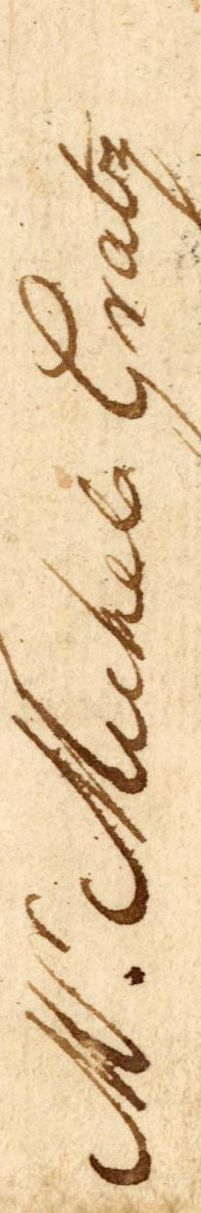M^r Michel Gratz
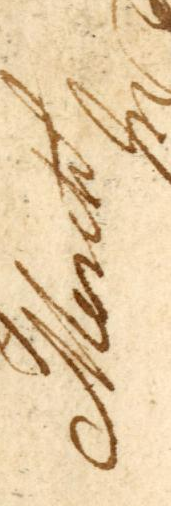Merch^t
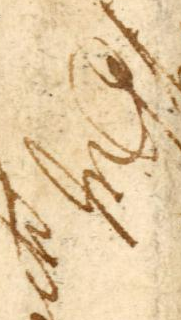In
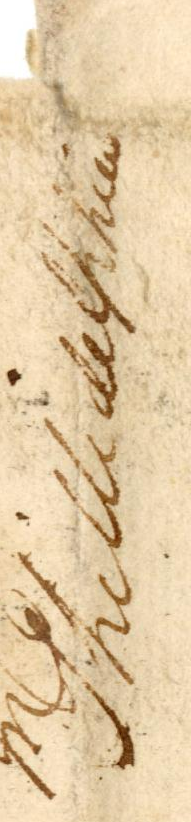Philadelphia
